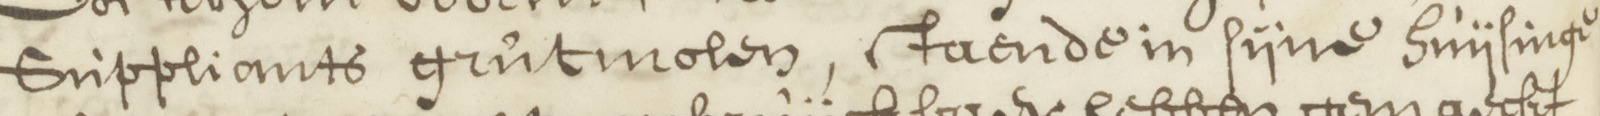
Suppliants grutmolen, staende in sijne huijsinge
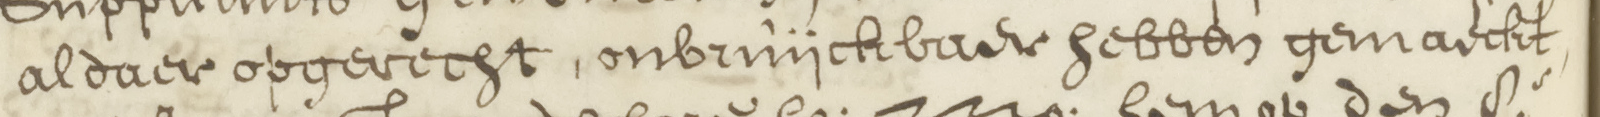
aldaer opgerecht, onbruijckbaer hebben gemaeckt,
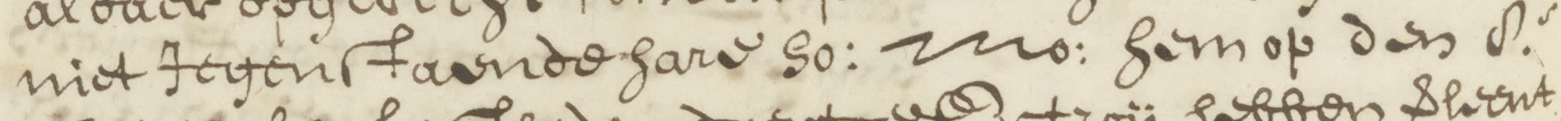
niet Jegenstaende hare ho:Mo: hem op den 8e.
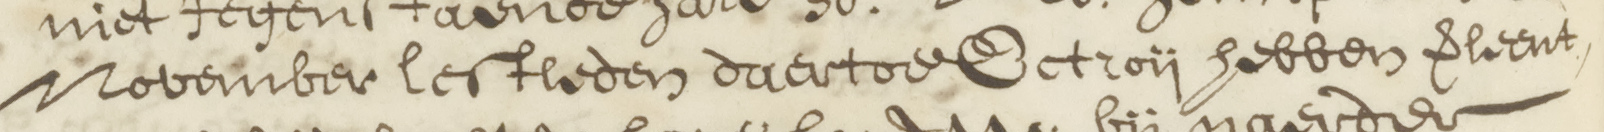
November lestleden daertoe Octroij hebben vleent,
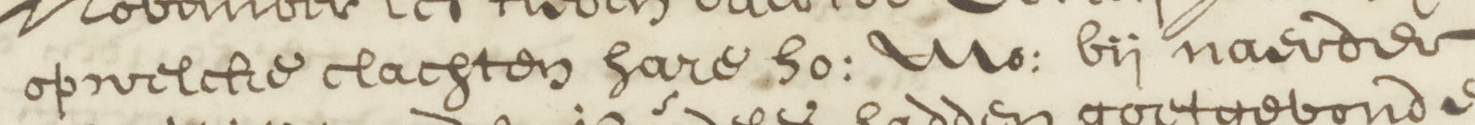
op welcke clachten hare ho:Mo: bij naerder
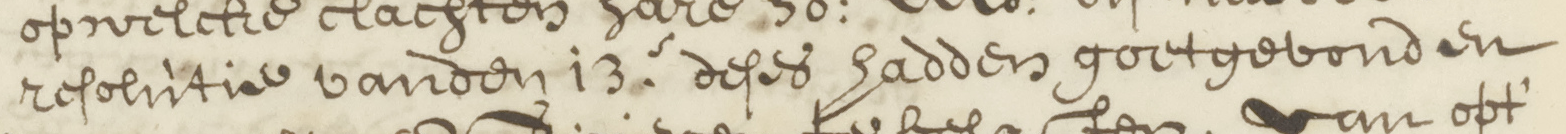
resolutie vanden 13e. deses hadden goetgevonden
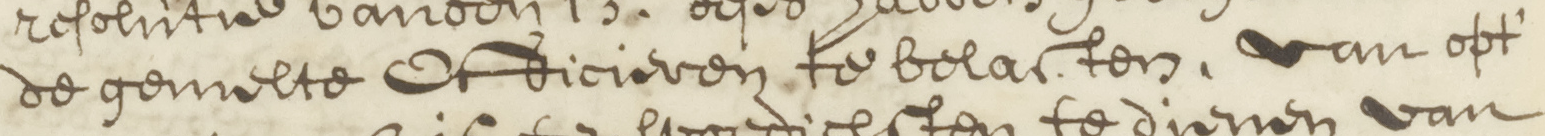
de gemelte Officieren te belasten, van opt'
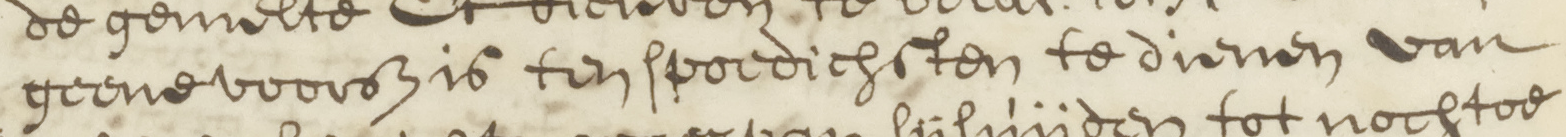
geene voorsz is ten spoedichsten te dienen van
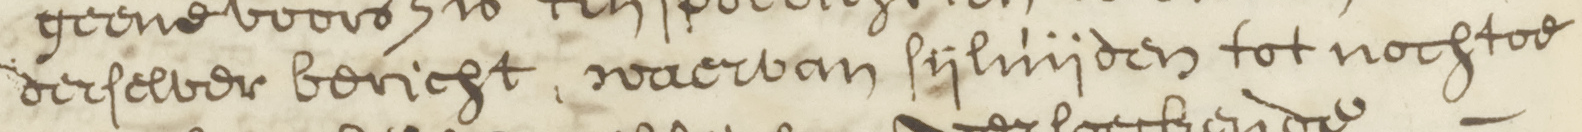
derselver bericht, waervan sijluijden tot noch toe
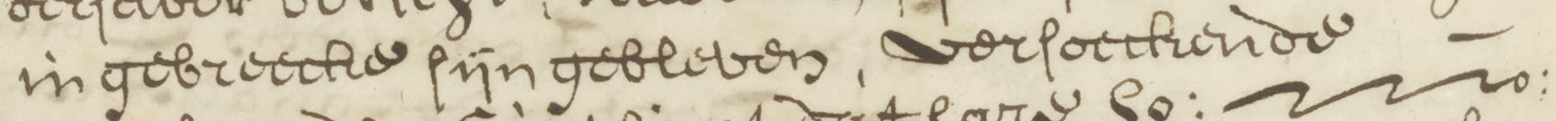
in gebreecke sijn gebleven, versoeckende —
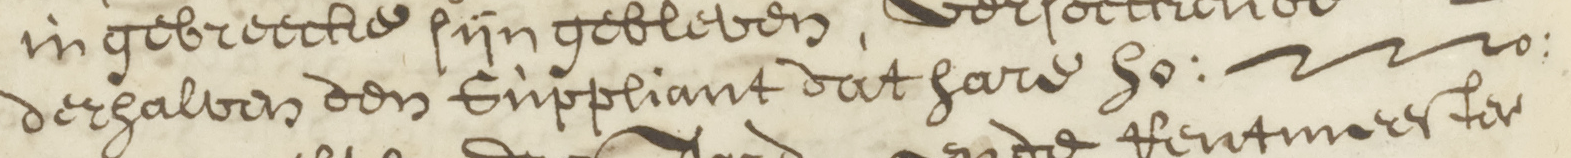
derhalven den Suppliant dat hare ho:Mo:
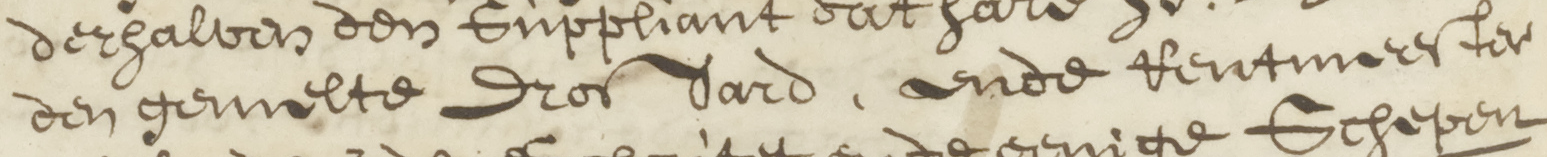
den gemelte Drossard, ende Rentmeester
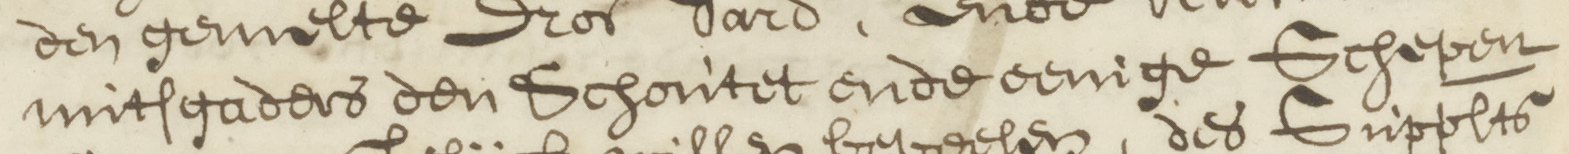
mitsgaders den Schoutet ende eenige Schepen
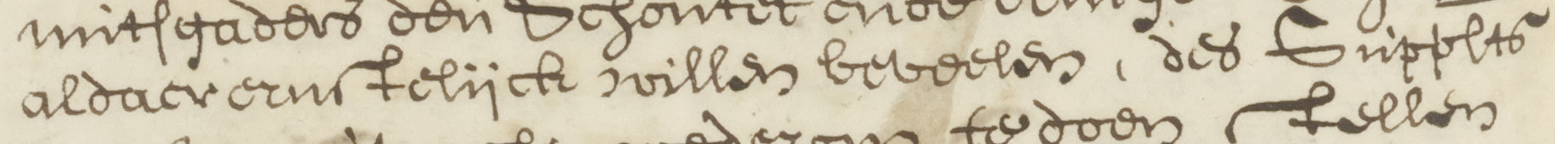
aldaer ernstelijck willen beveelen, des Supplts
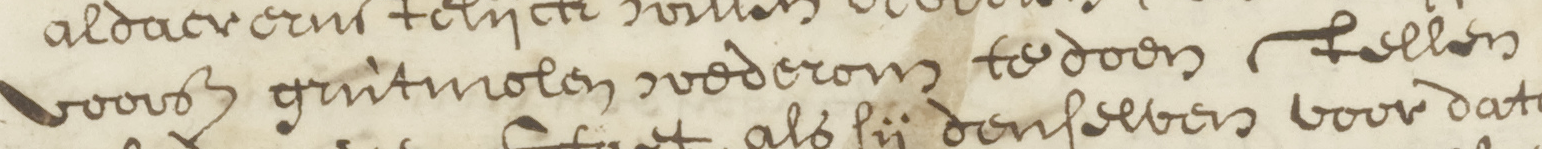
voorsz grutmolen wederom te doen stellen
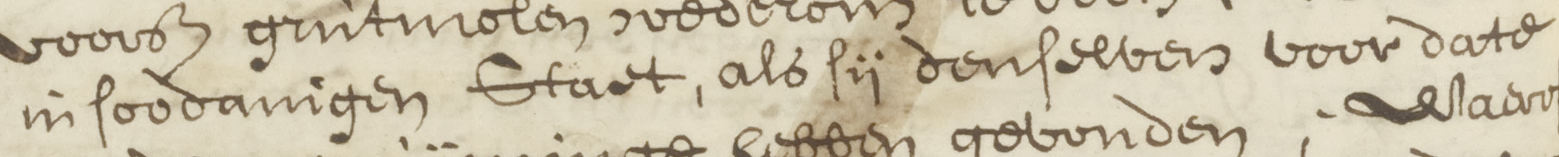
in soodanigen Staet, als sij denselven voor date
